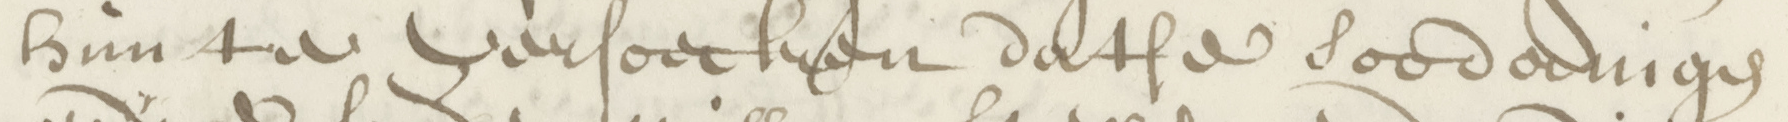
hun te versoecken datse soodanige
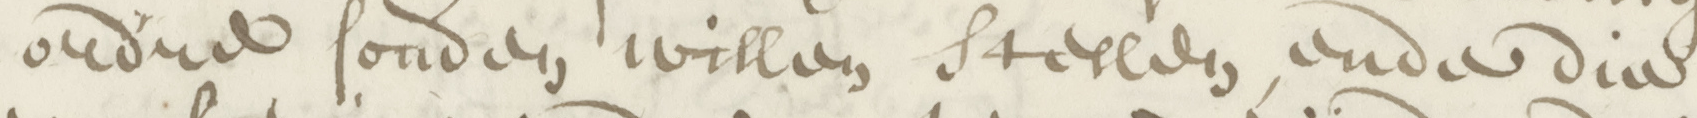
ordre souden willen stellen, ende die
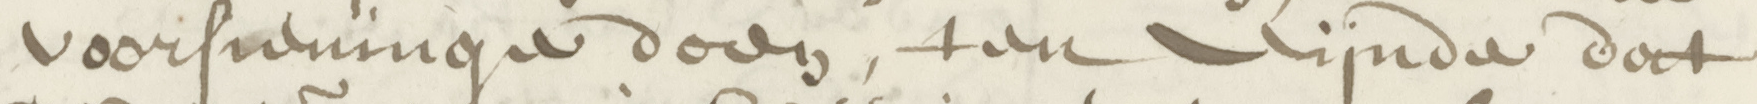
voorsieninge doen, ten Eijnde dat
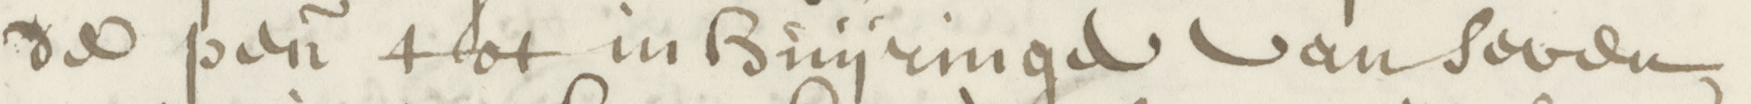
vade pen tot inhuijringe van seven„
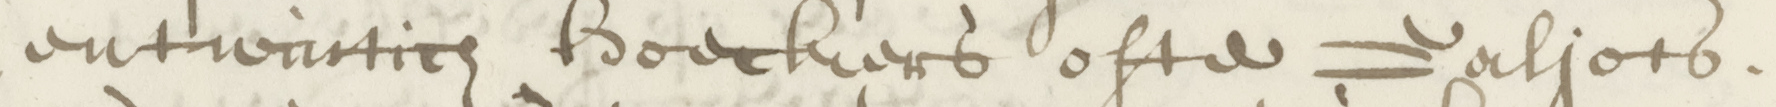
entwintich hoeckers ofte Galjots,
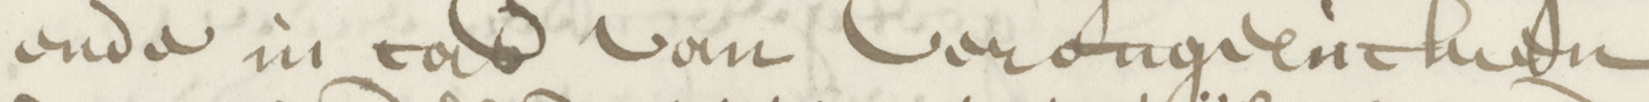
ende in cas van verongelucken
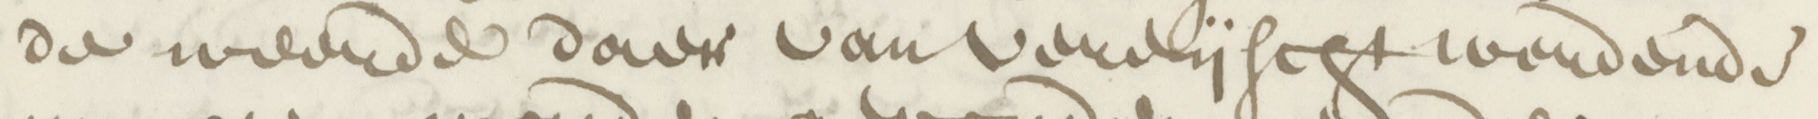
de weerde daer van vereijscht werdende
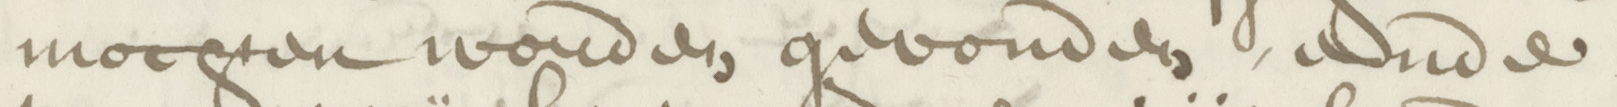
mochten worden gevonden, ende
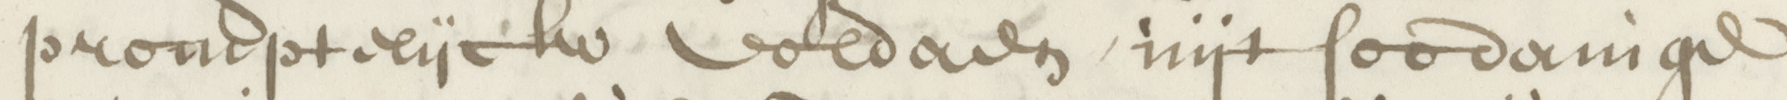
promptelijck voldaen, uijt soodanige
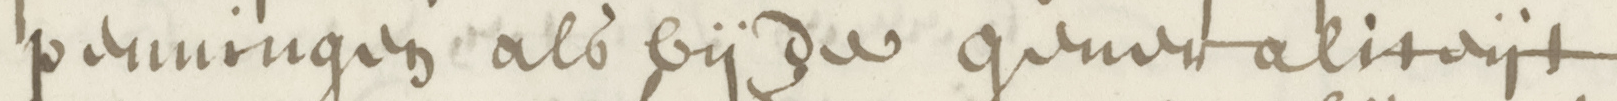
penningen als bij de generaliteijt
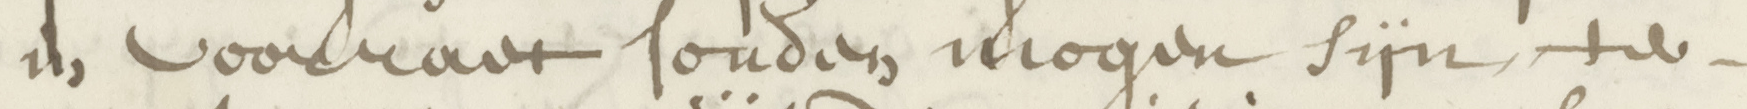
in voorraet souden mogen sijn, te
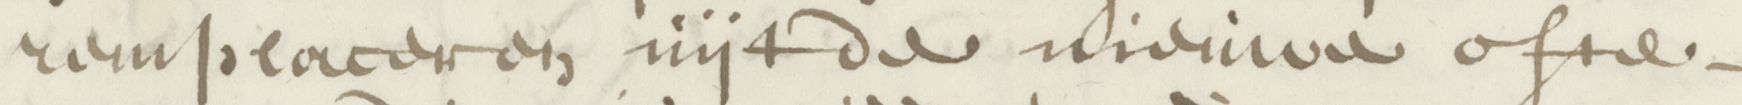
remplaceren uijt de nieuwe ofte
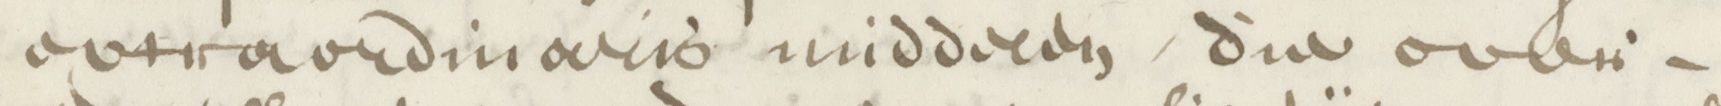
extraordinaris middelen, die over
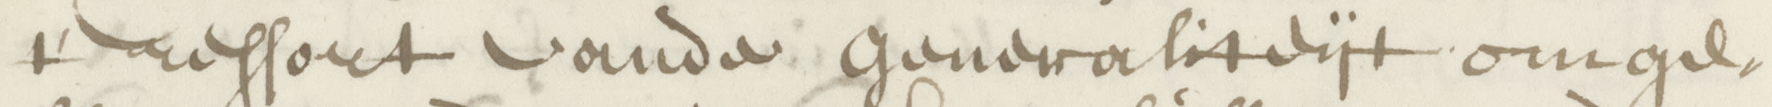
t' ressort vande generaliteijt omge„
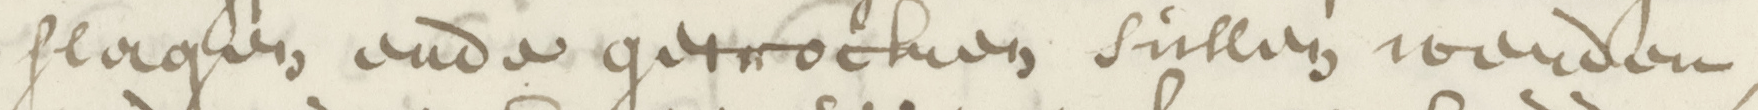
slagen ende getrocken sullen werden
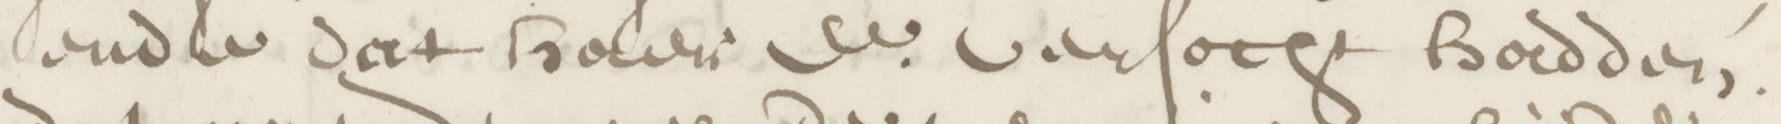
ende dat haer E. versocht hadden,
